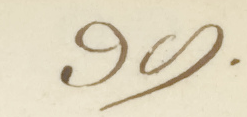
98.
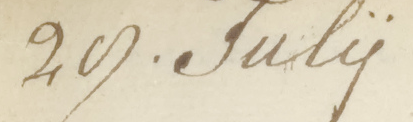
29. Julij
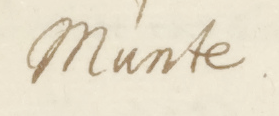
Munte
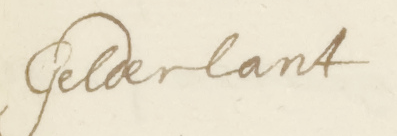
Gelderlant
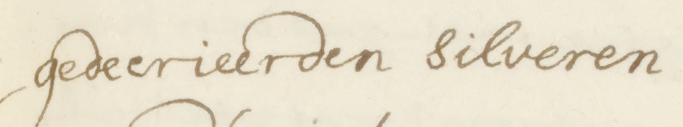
gedecrieerden silveren
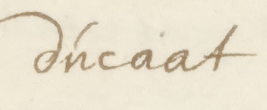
ducaat
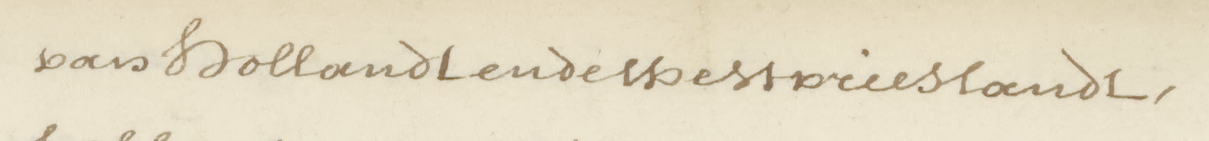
van Hollandt ende westvrieslandt,
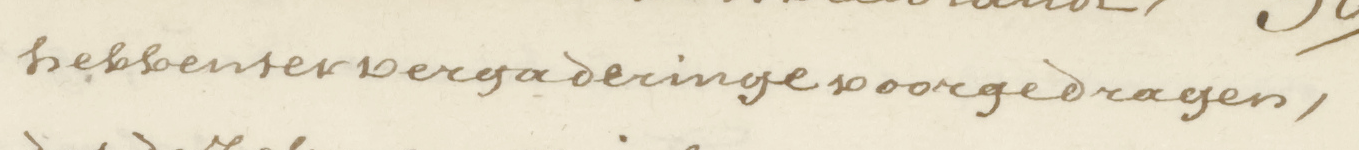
hebben ter vergaderinge voorgedragen,
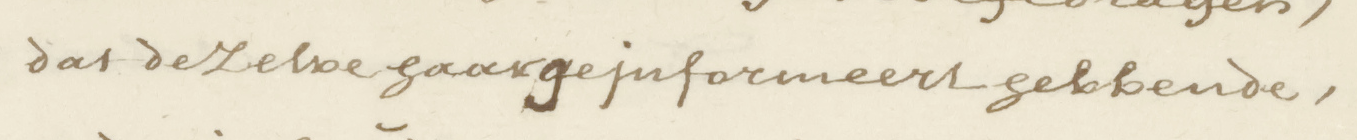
dat dezelve haar geinformeert hebbende,
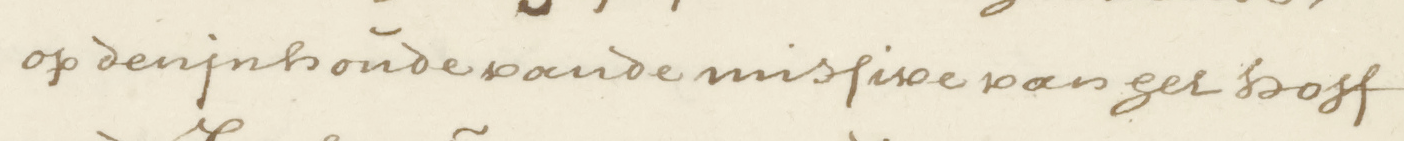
op den inhoude vande missive van het Hoff
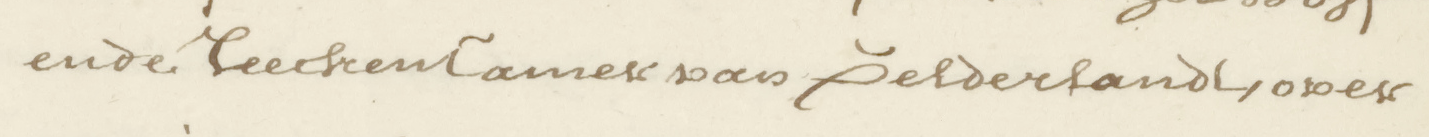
ende ReeckenCamer van Gelderlandt, over
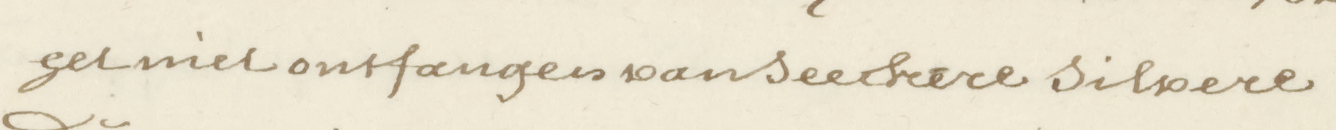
het niet ontfangen van seeckere silvere
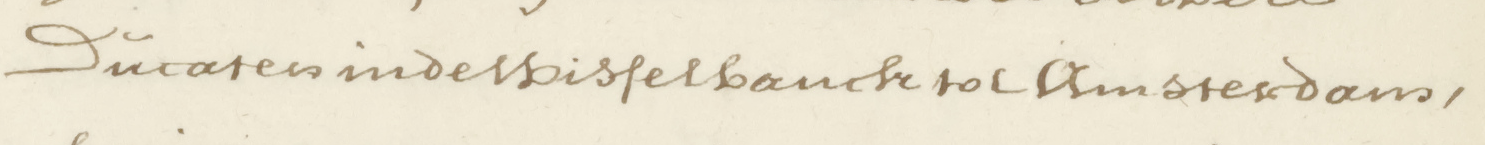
Ducaten inde Wisselbanck tot Amsterdam,
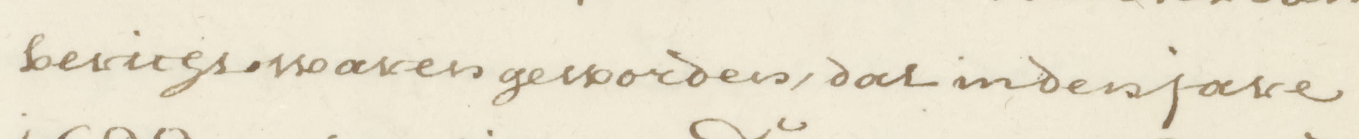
bericht waren geworden, dat inden jare
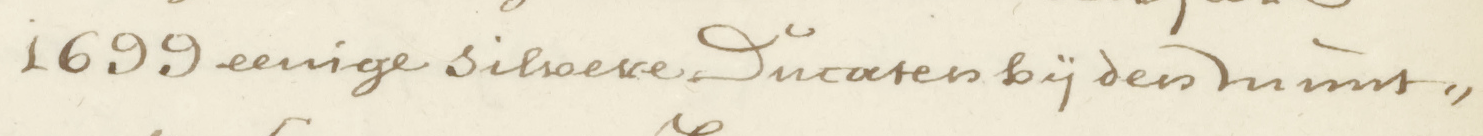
1699 eenige silvere Ducaten bij den Munt„
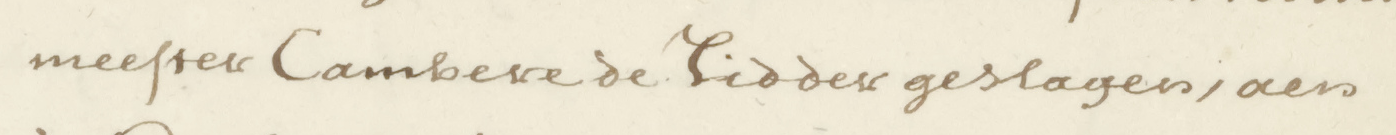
meester Cambere de Ridder geslagen, aen
